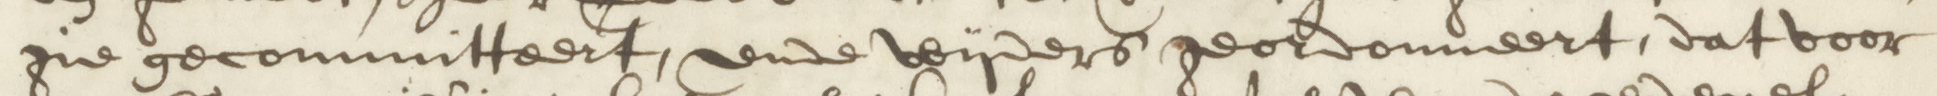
gie gecommitteert, ende wijders geordonneert, dat voor
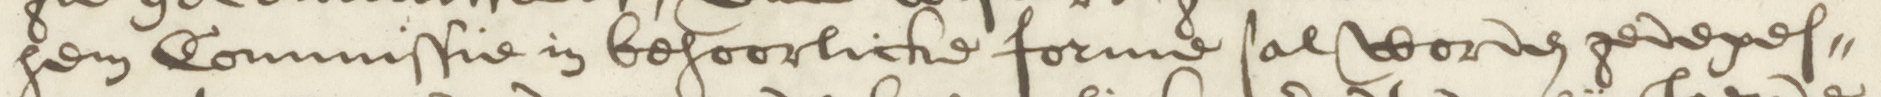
hem commissie in behoorlicke forme sal worden gedepes„
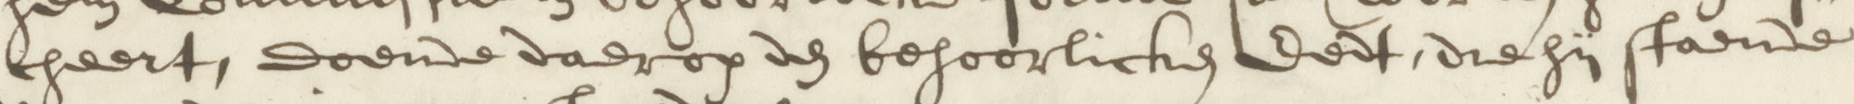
cheert, doende daerop den behoorlicken eedt, die hij staende
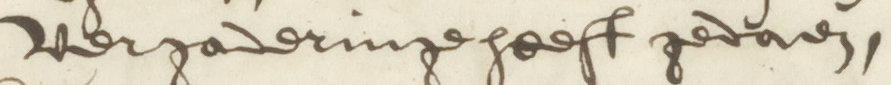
vergaderinge heeft gedaen.
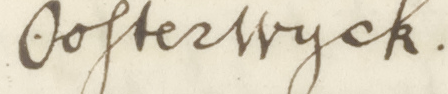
Oosterwijck
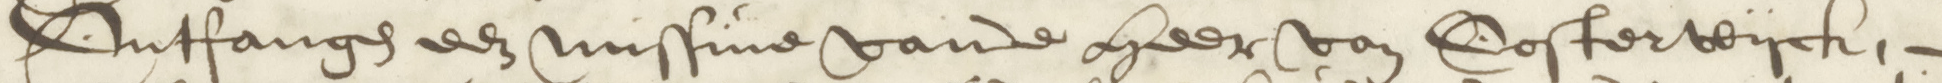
Ontfangen een missive vande heer van Oosterwijck -
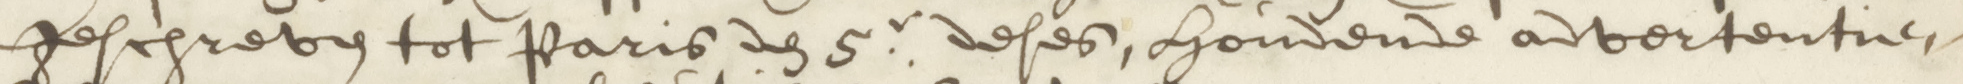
geschreven tot Paris den 5e. deses, houdende advertentien.
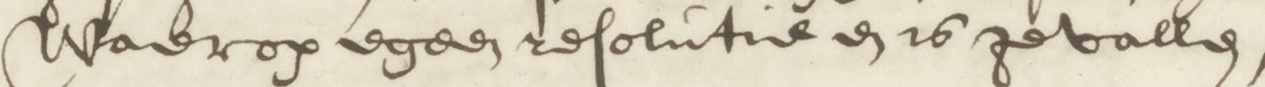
Waerop egeen resolutie en is gevallen.
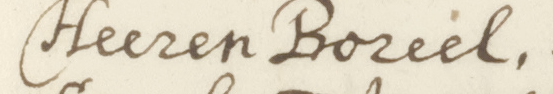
Heeren Boreel,
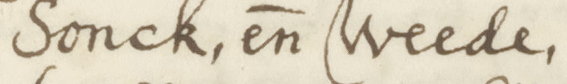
Sonck, en Weeda,
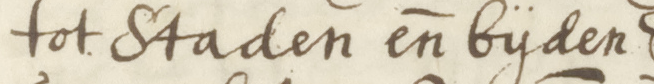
tot Staden en bijden
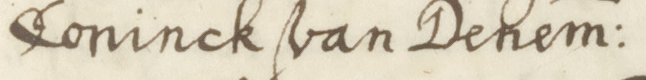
Coninck van Denem:
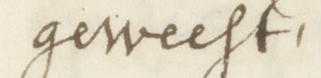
geweest
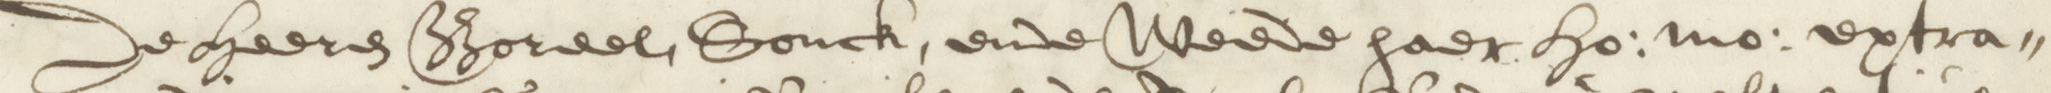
De heeren Boreel, Sonck ende Weede haer Ho:Mo: extra„
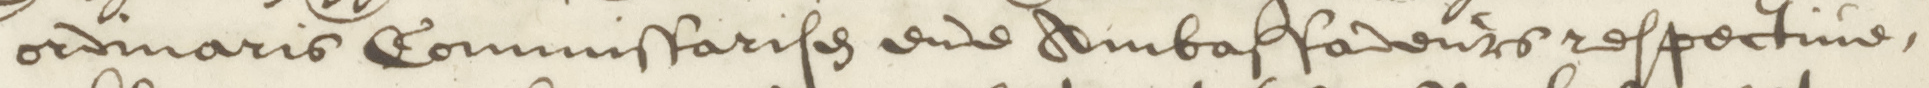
ordiniaris Commissarisen ende Ambassadeurs respectiue,
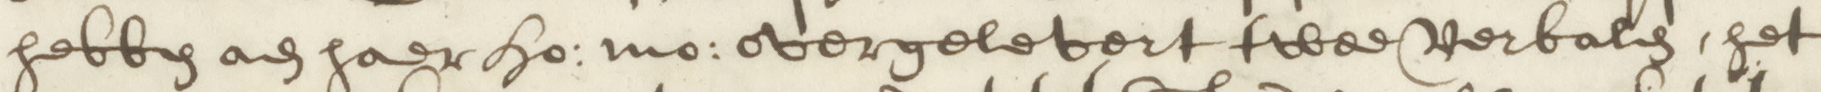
hebben aen haer Ho:Mo: overgelevert twee verbalen, het
